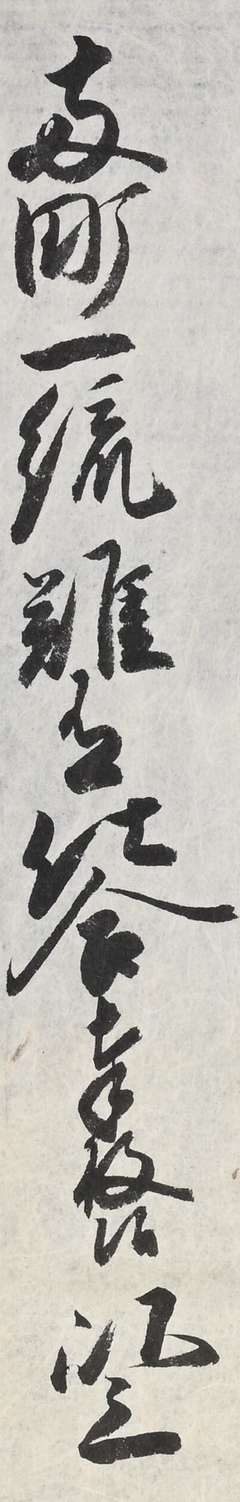両町一統難有仕合奉存候以上
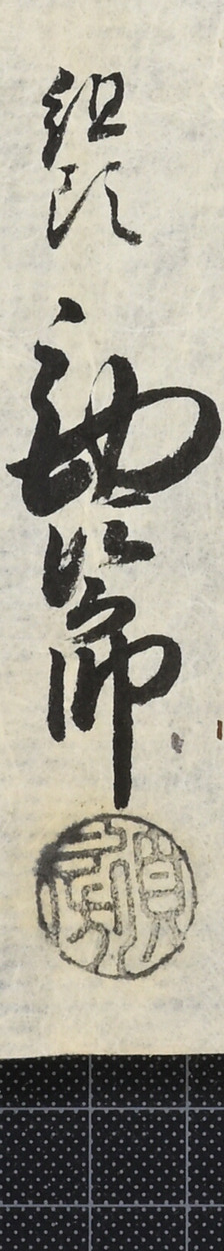組頭勘次郎㊞

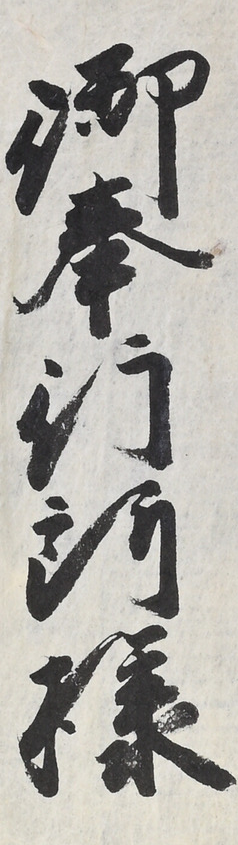御奉行所様
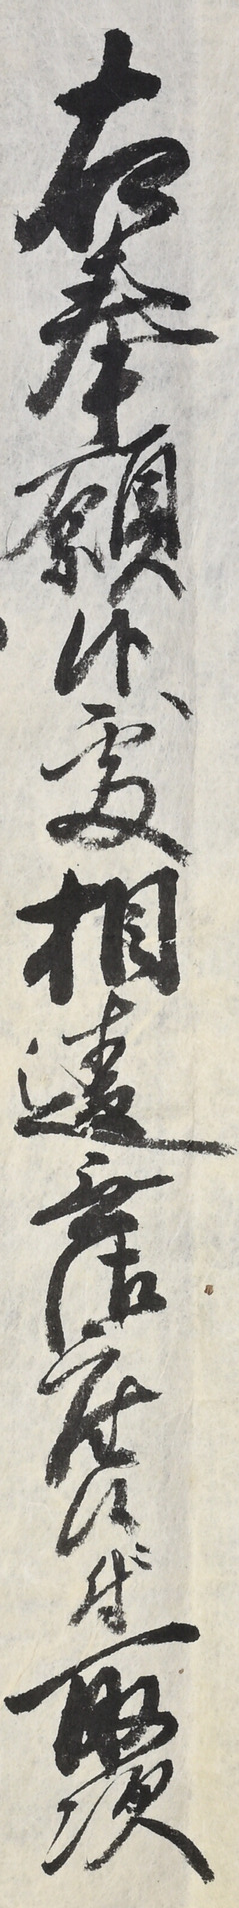右奉願候処相違無御座候ニ付取次
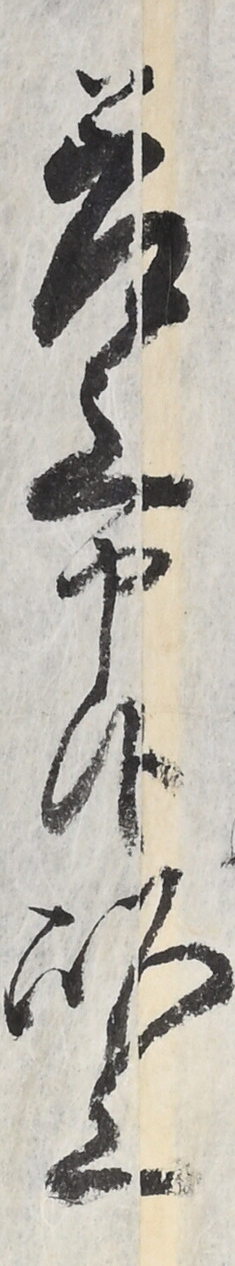差上申候以上

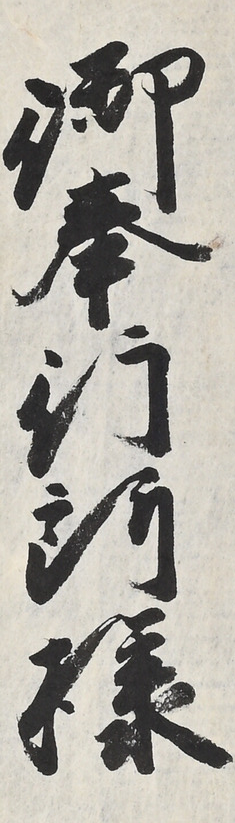御奉行所様
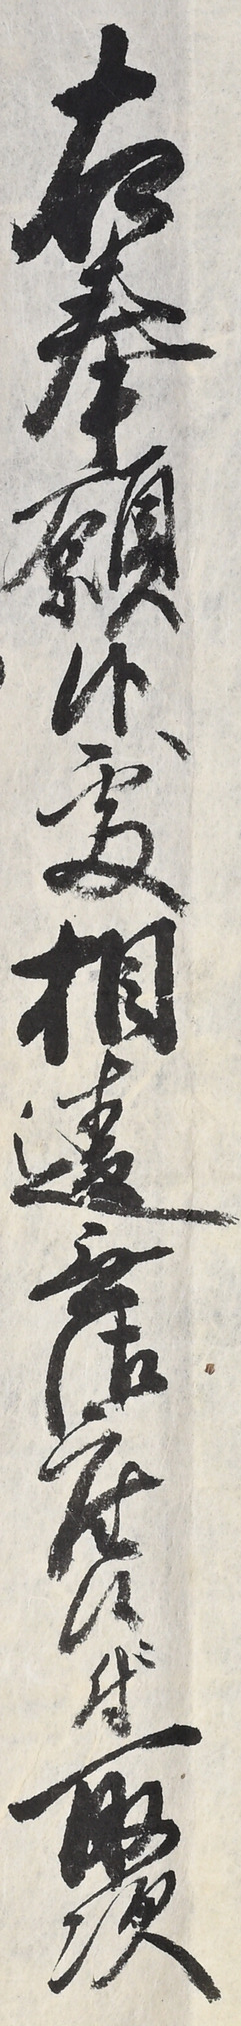右奉願候処相違無御座候ニ付取次
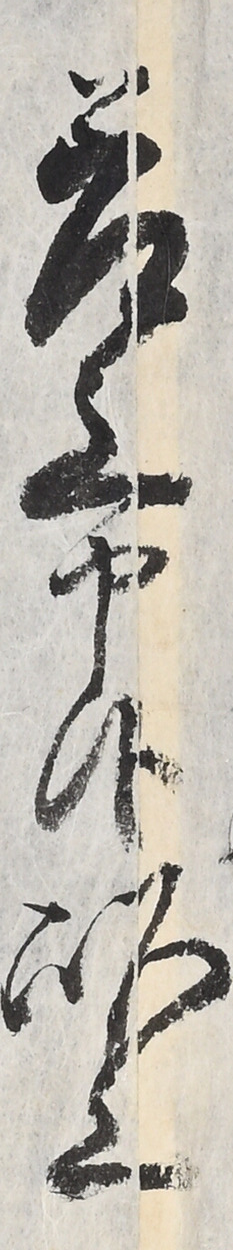差上申候以上
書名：乍恐以口上書奉願上候御事
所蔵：伊那市立高遠町図書館・合同会社AMANE
